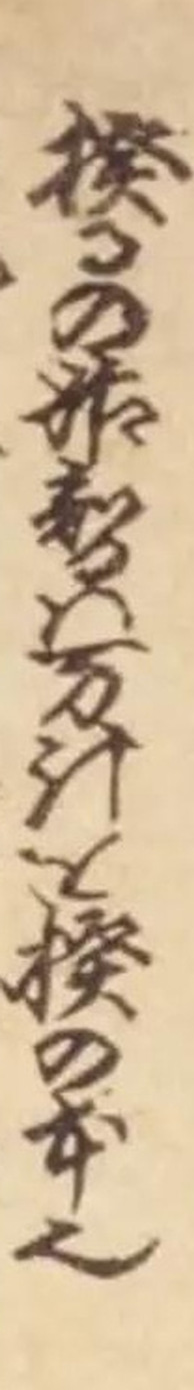揆るの始智は万計を揆の本也
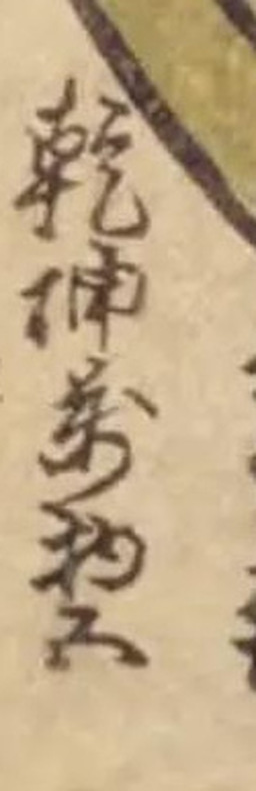乾坤万物五
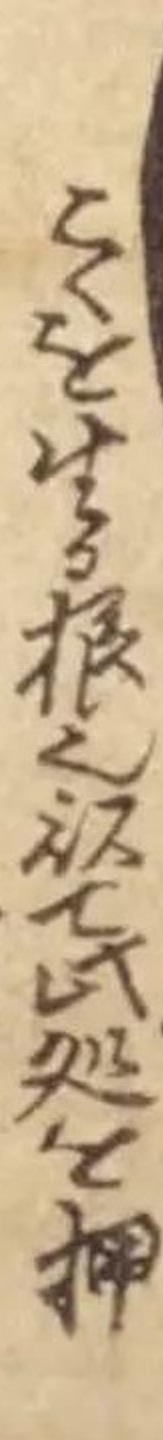こくを生る根也以て此処を押
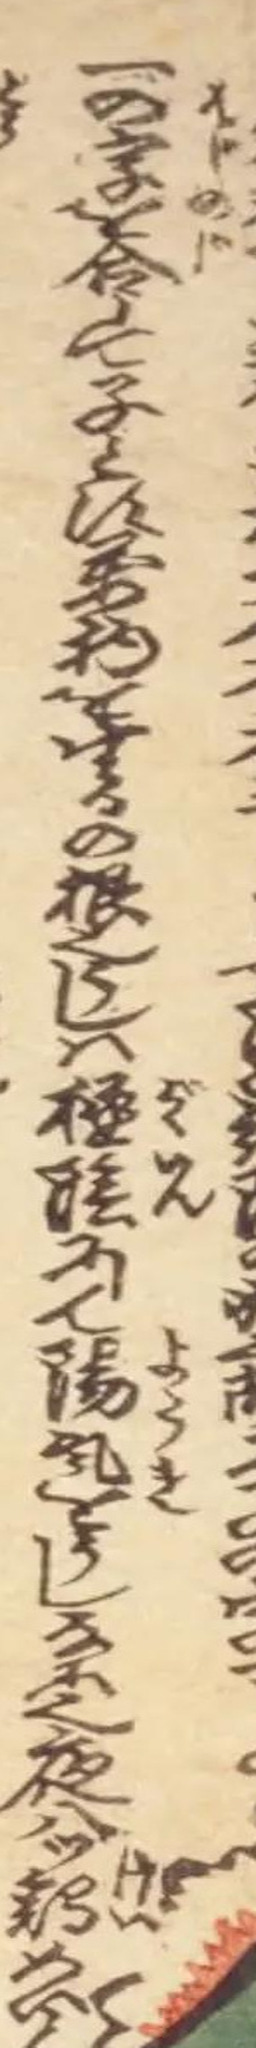一の字を合して子とす万物を生るの根也うしは極陰にして陽気をうしなふ也夜八ツ鶏めいと云物の終也
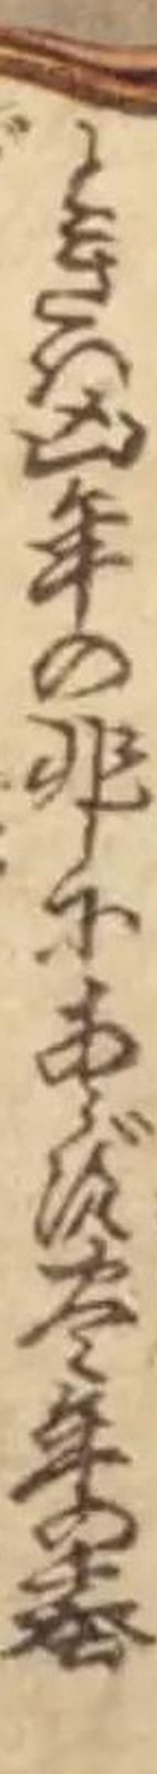ときは凶年の兆しにあらず豊年の
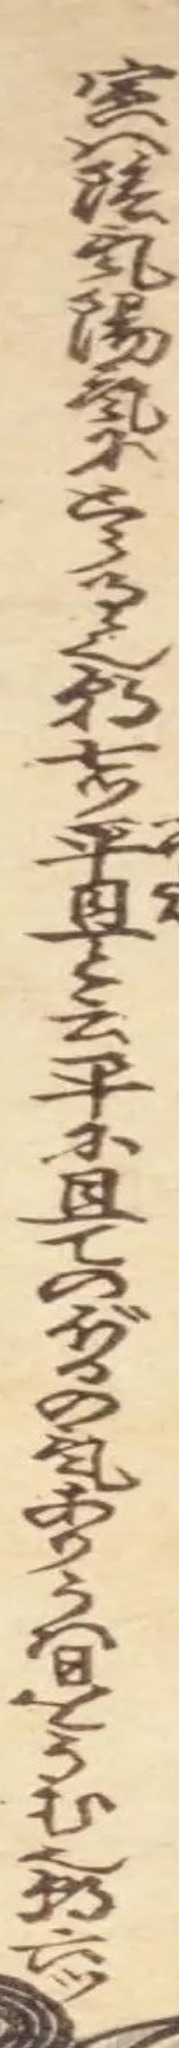寅は陰気陽気にとらるゝ也朝七ツ平旦と云平に旦てのぼるの気ありうは日をうむ也朝六ツ
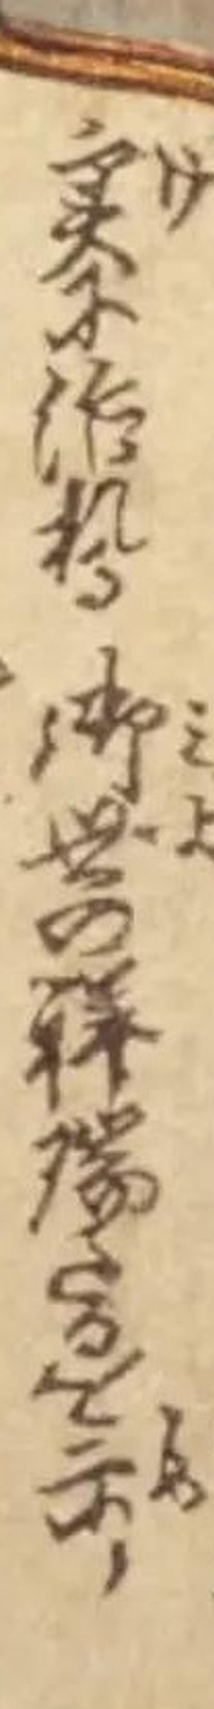実に作れる御世の祥瑞たるを示し
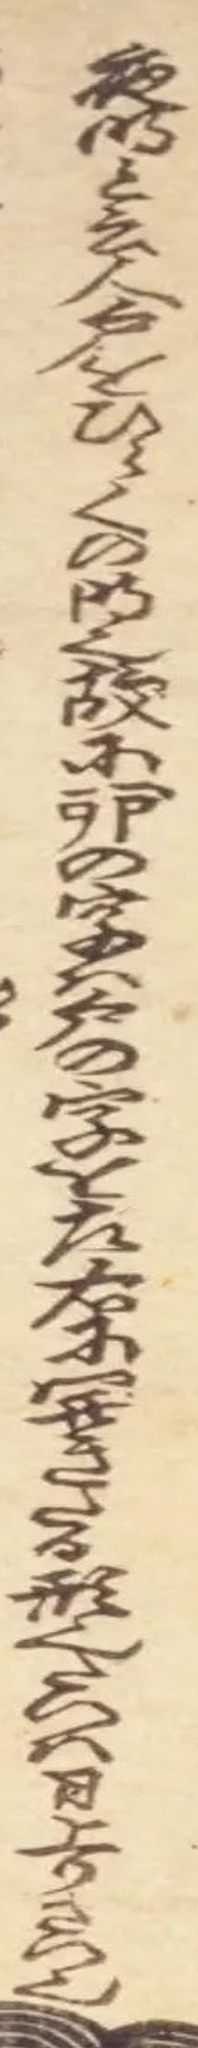夜明と云人戸をひらくの時也故に卯の字は戸の字を左右に開きたる形也たつは日上りたつ也
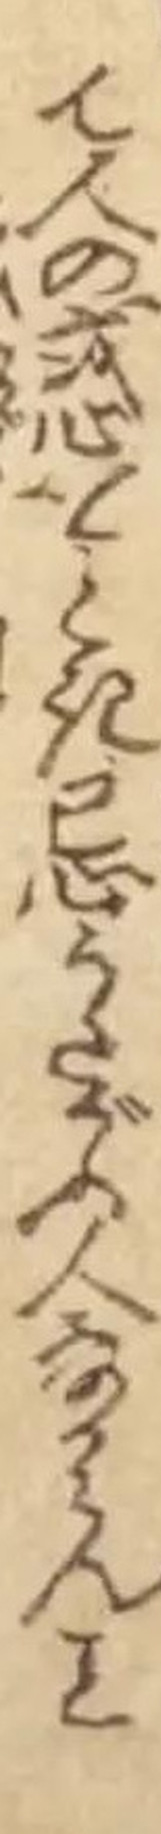て人の惑をとき忌うたがふ人なからんこと
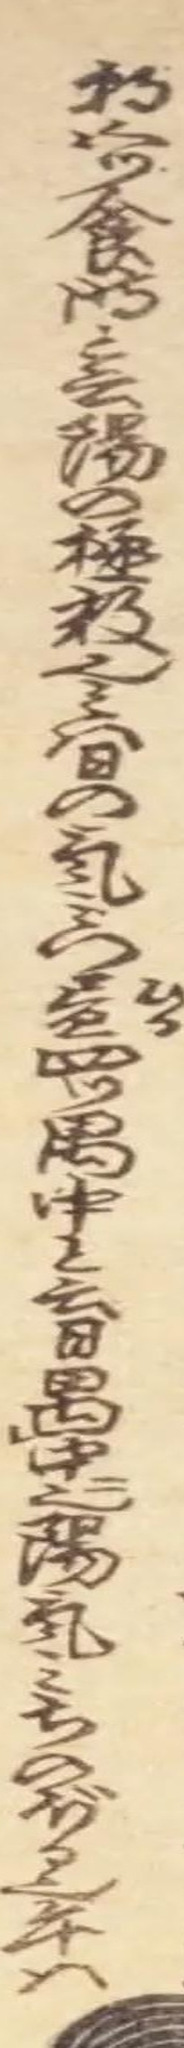朝五ツ食時と云陽の極致也みは日の気みつ昼四ツ禺中と云日禺中也陽気みちのぼる也午は
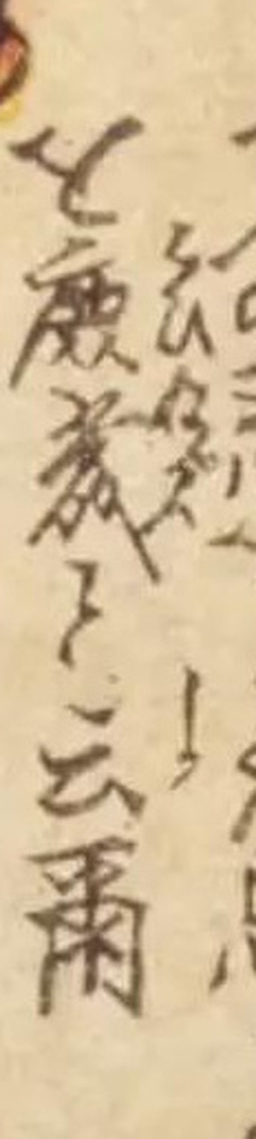を庶幾と云爾
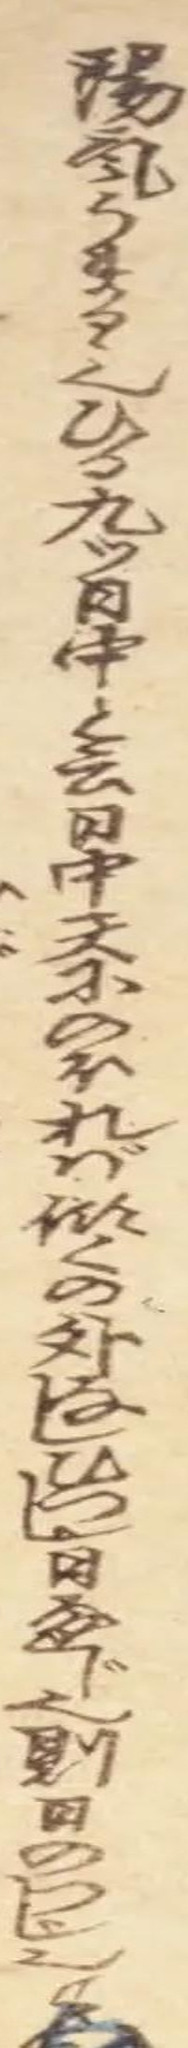陽気うまるゝ也ひる九ツ日中と云日中天にのほれば傾くの外なしひつじ日通じ也則日のつじ也
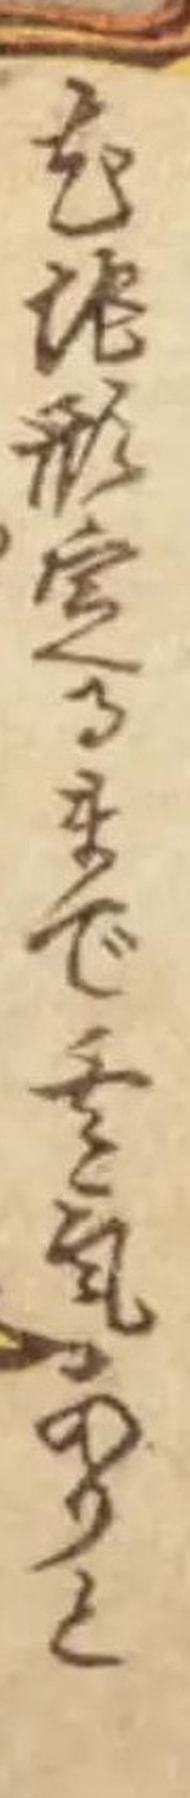尤地形定るまで其気ありと
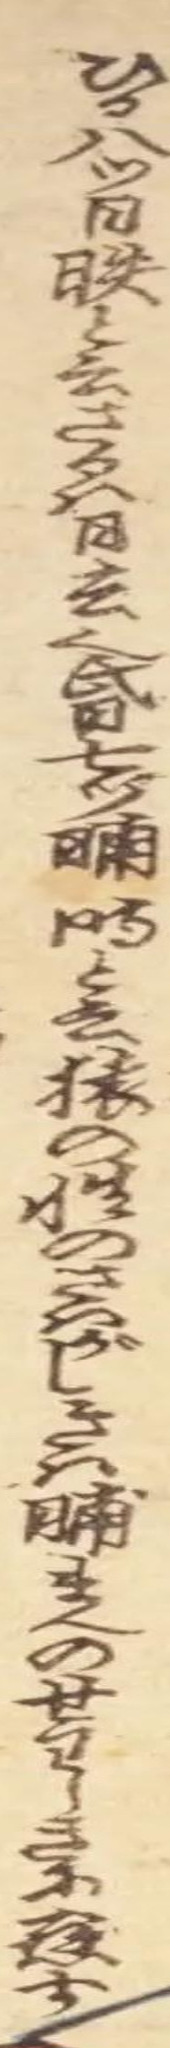ひる八ツ日昳と云さるは日去也昏七ツ晡時と云猿の性のさはがしきは晡まへのせわしきに発す
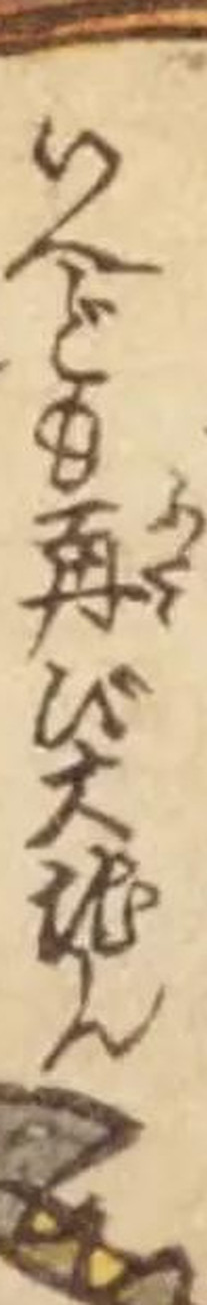いへども再び大地しん
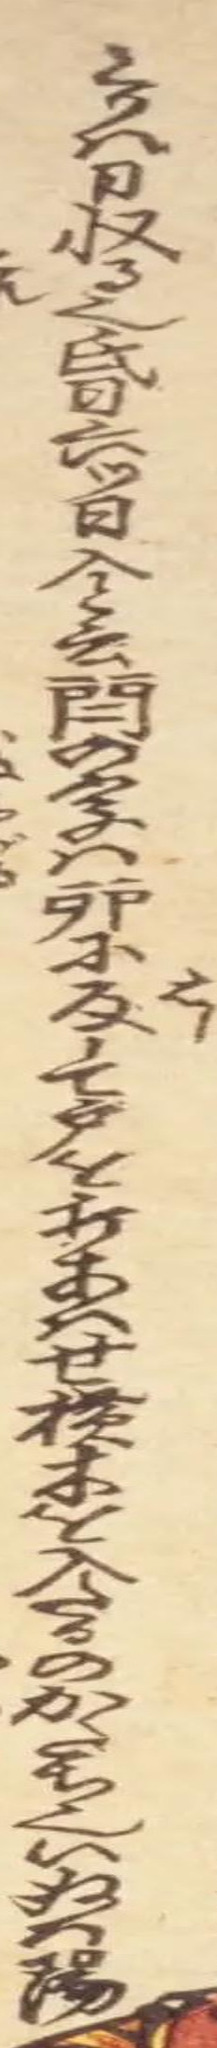とりは日収る也昏六ツ日入と云酉の字は卯に反して戸を打あはせ横木を入たるのかたち也いぬは陽
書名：地震吉凶之弁
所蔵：国立国会図書館 National Diet Library, JAPAN
